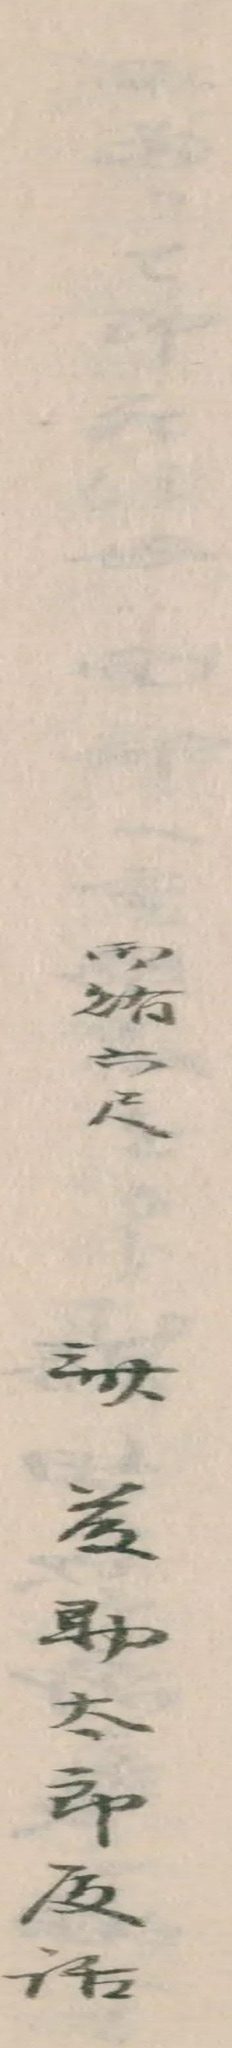御賄六尺無藤助太郎殿話
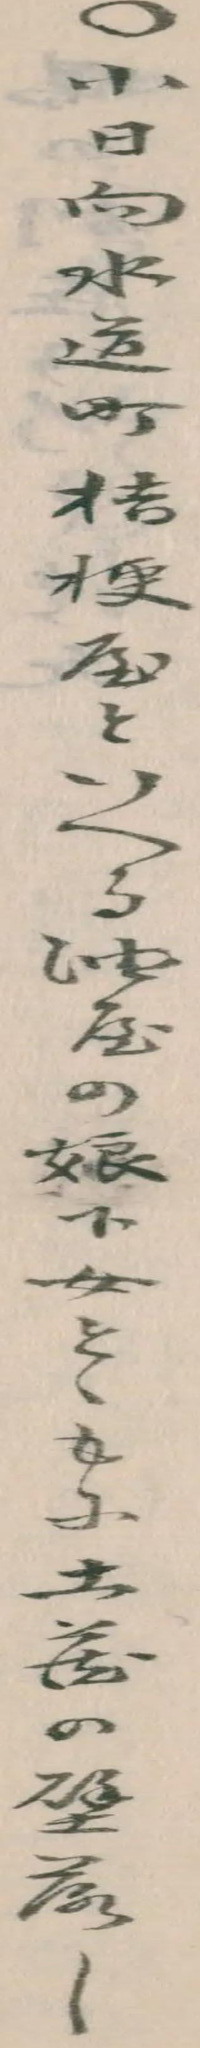〇小日向水道町桔梗屋といへる油屋の娘下女とゝもに土蔵の壁落し
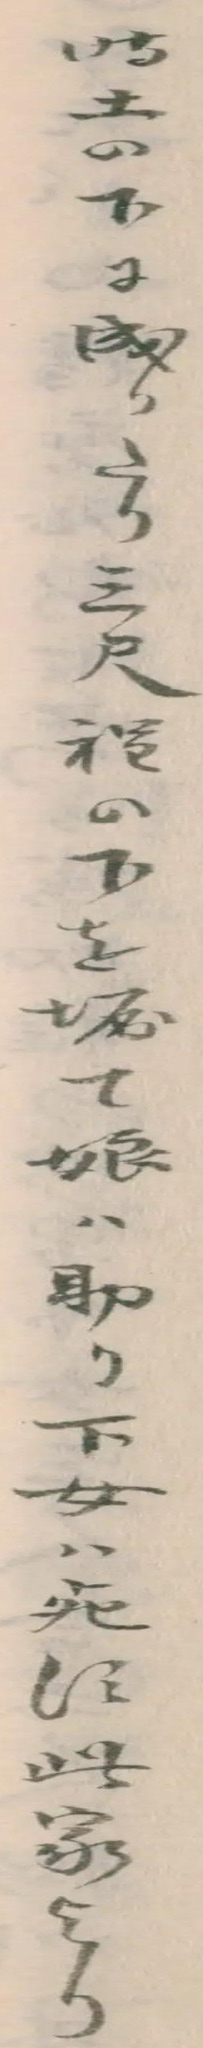時土の下に成りたり三尺程の下を掘て娘は助り下女は死す此家より
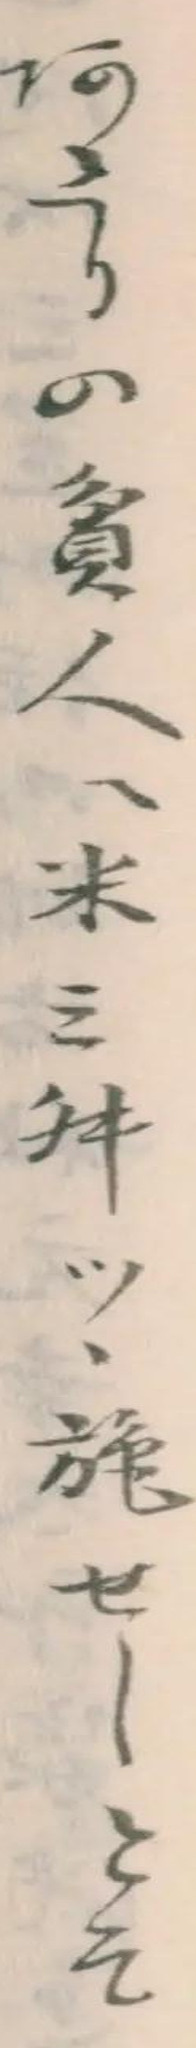あたりの貧人へ米三升ツヽ施せしとそ
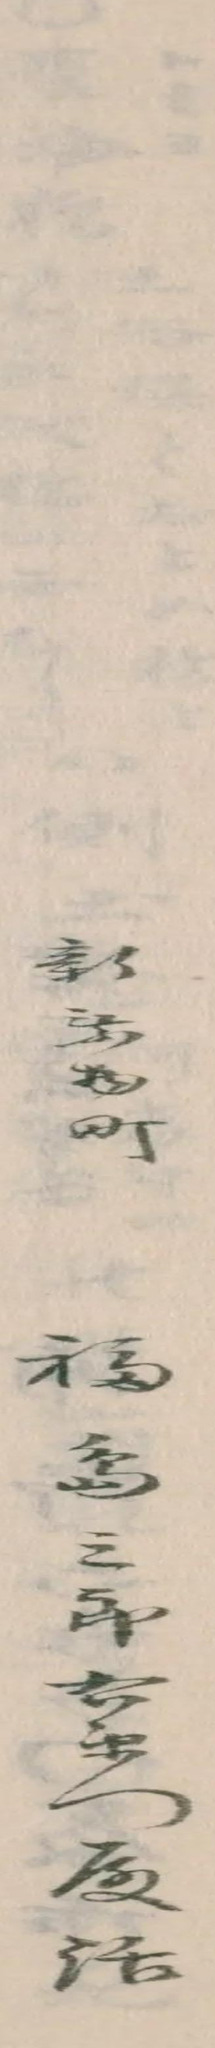新乗物町福島三郎右衛門殿話
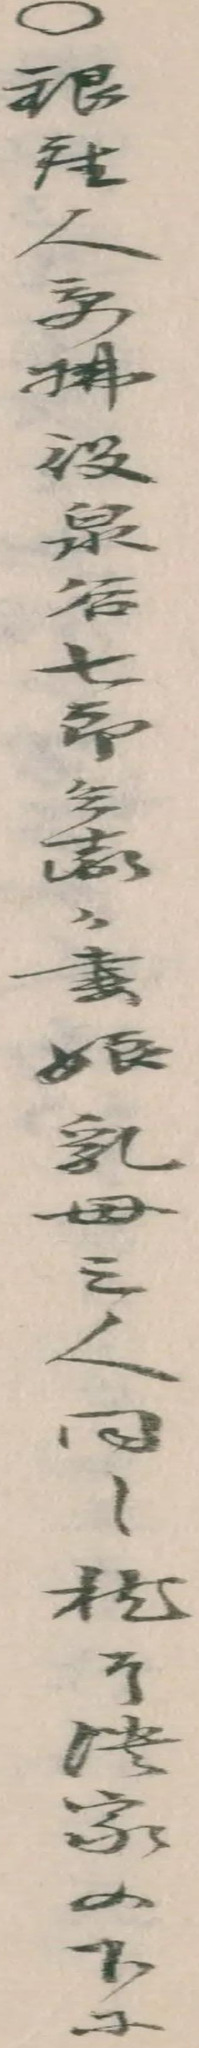〇銀座人受払役泉谷七郎兵衛か妻娘乳母三人同し枕に潰家の下に
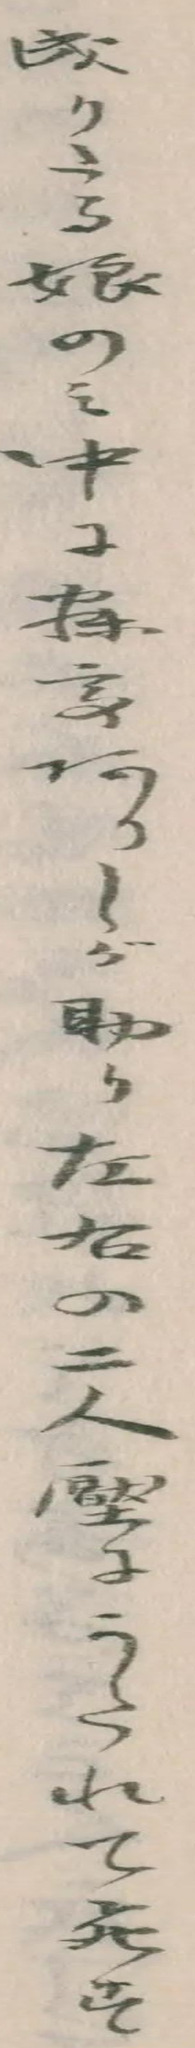成りたる娘のみ中に寐てありしが助り左右の二人圧にうたれて死す
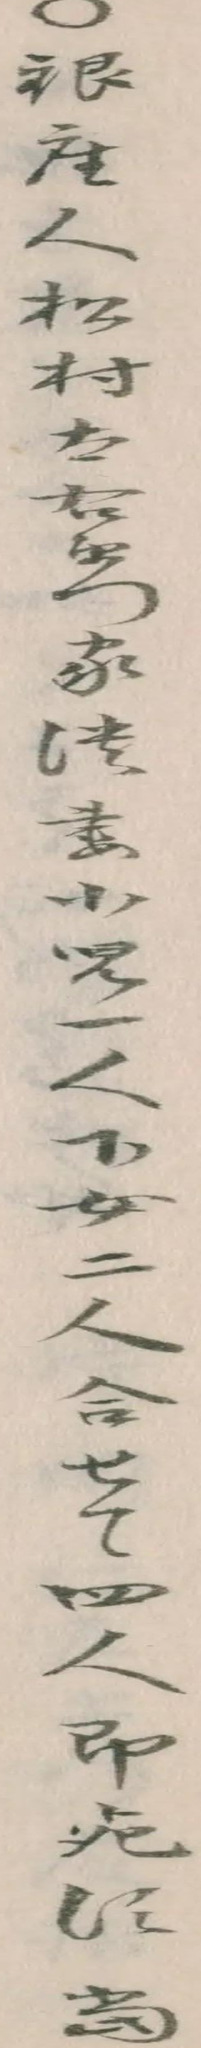〇銀座人松村太右衛門家潰妻小児一人下女二人合せて四人即死す当
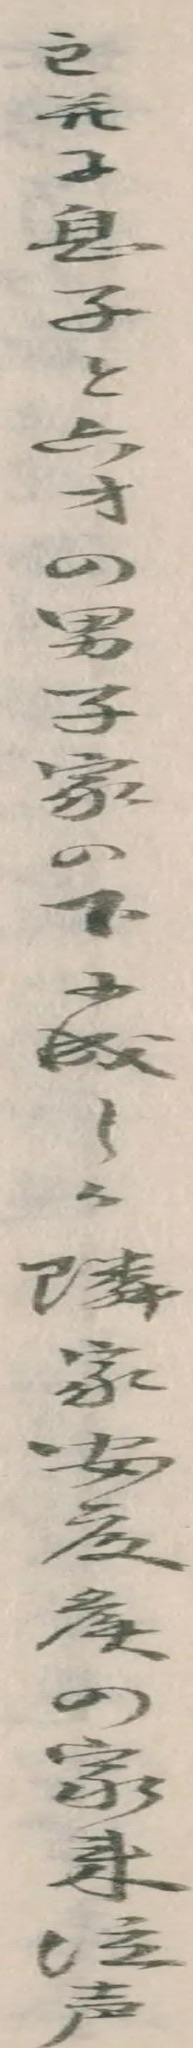主并に息子と六才の男子家の下に成しか隣家安藤侯の家来泣声
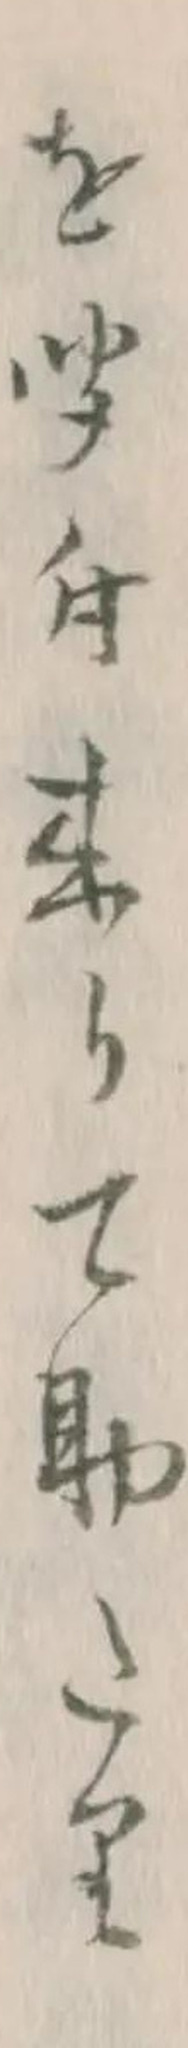を聞付来りて助たり
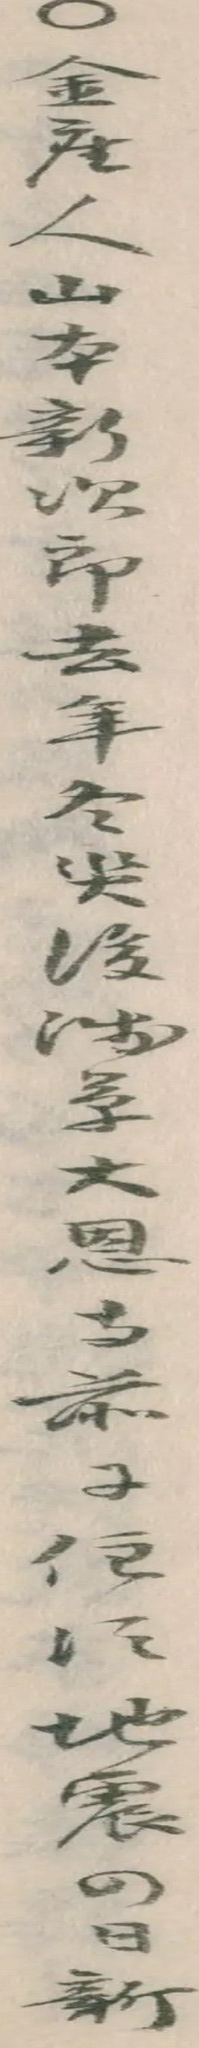〇金座人山本新次郎去年冬災後浅草大恩寺前に住す地震の日新

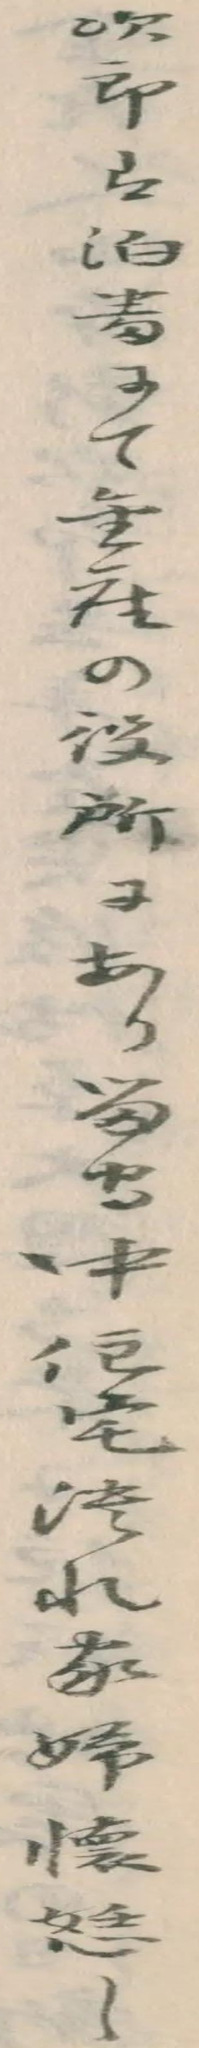次郎は泊番にて金座の役所にあり留守中住宅潰れ家婦懐妊し
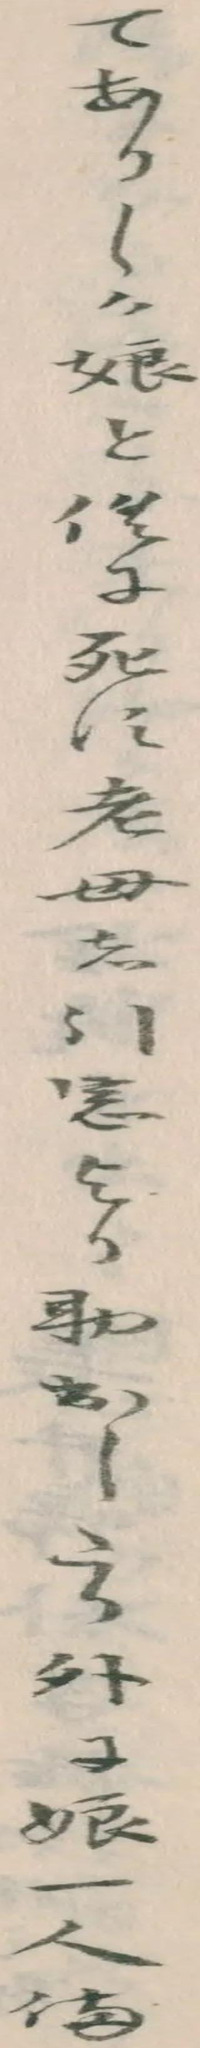てありしか娘と倶に死す老母は引窓より助出したり外に娘一人持
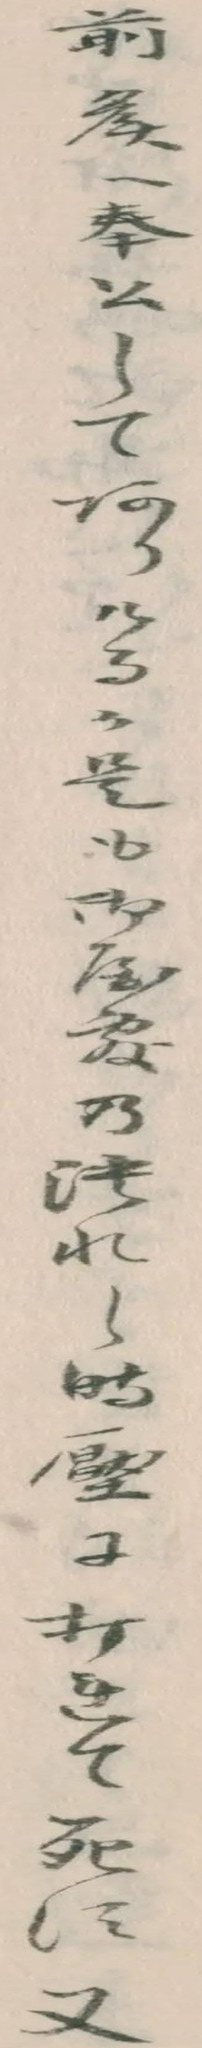前侯へ奉公してありけるか是も御屋敷の潰れし時圧に打れて死す又
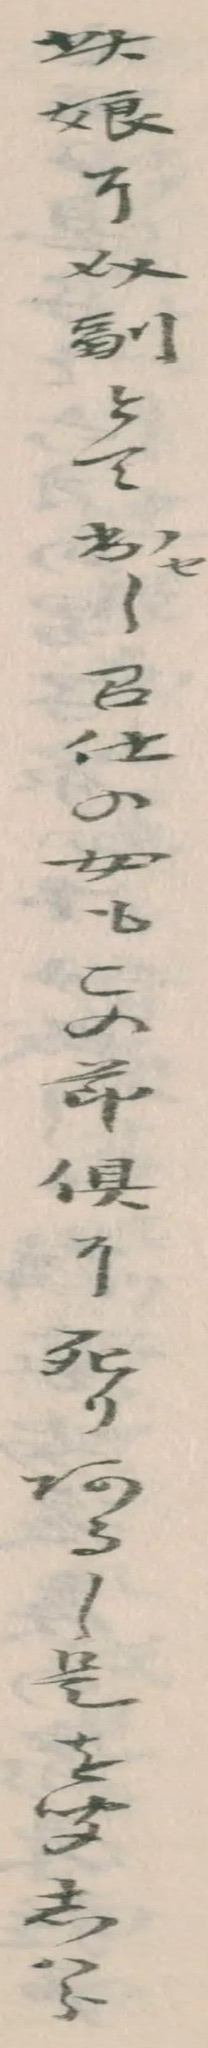此娘に介副とて出せし召仕の女もこの節倶に死りあるし是を聞しはら
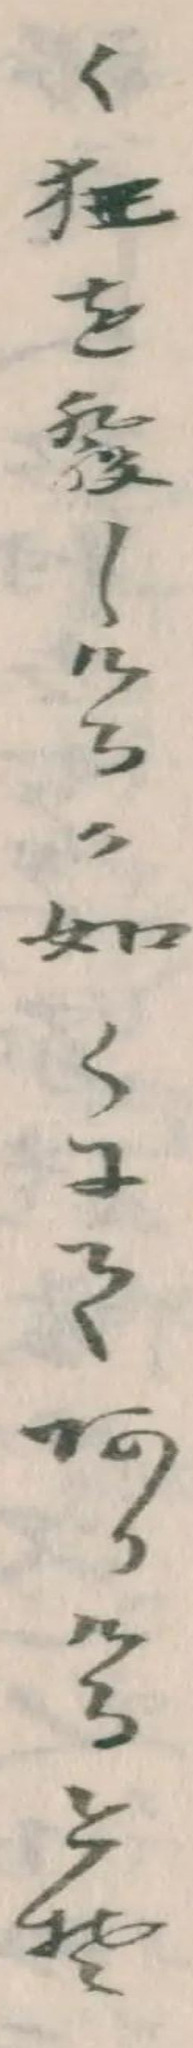く狂を発しけるか如くにてありけるとそ
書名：地災撮要. 巻7-9(地震之部)
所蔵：国立国会図書館 National Diet Library, JAPAN
